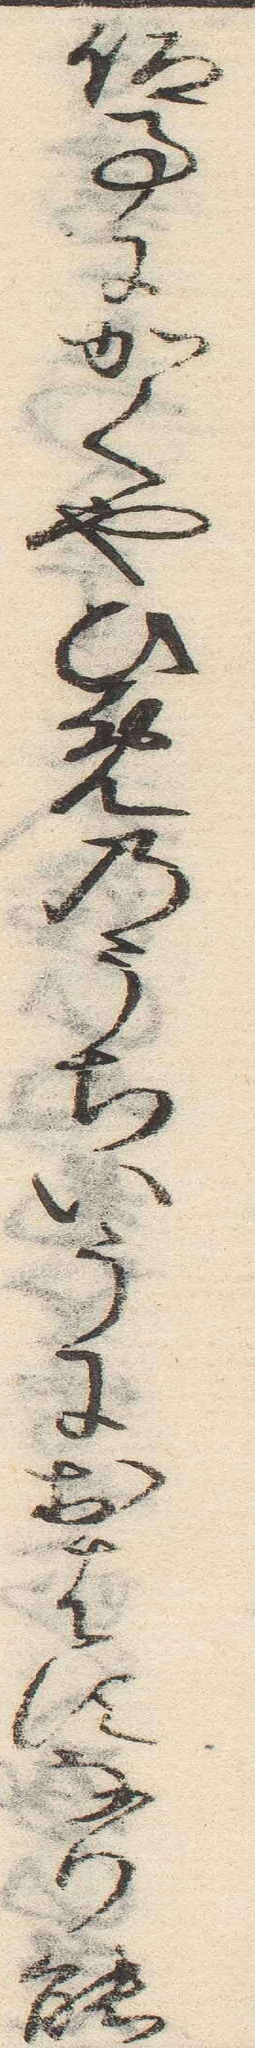仰事にかくやひめのうちいうにおはすなり能
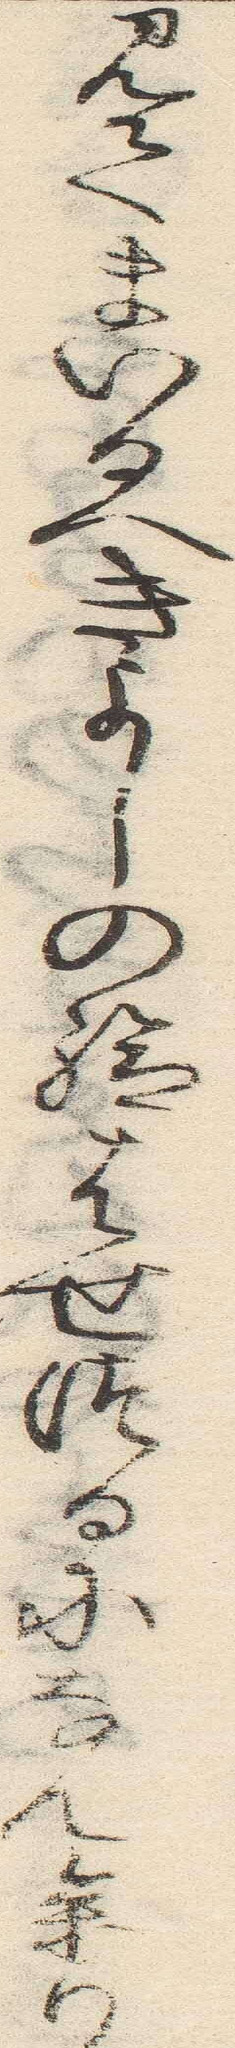見てまいるへきよしの給はせつるになん参り
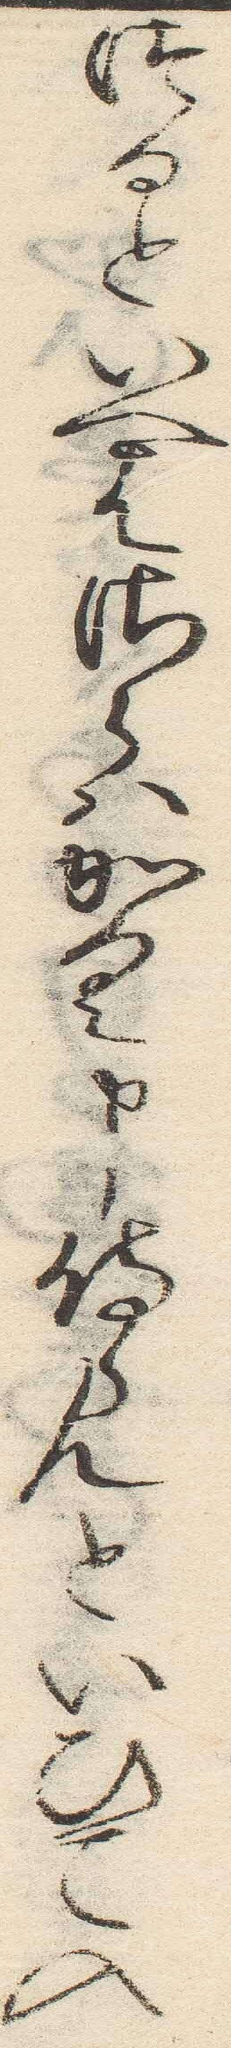つるといへはさらはかく申侍らんといひて入
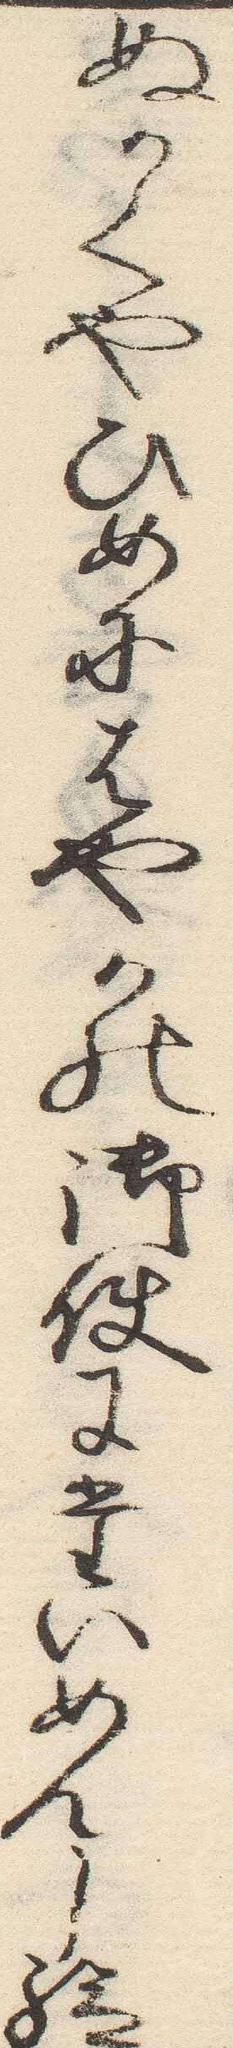ぬかくやひめにはやかの御使にたいめんし給
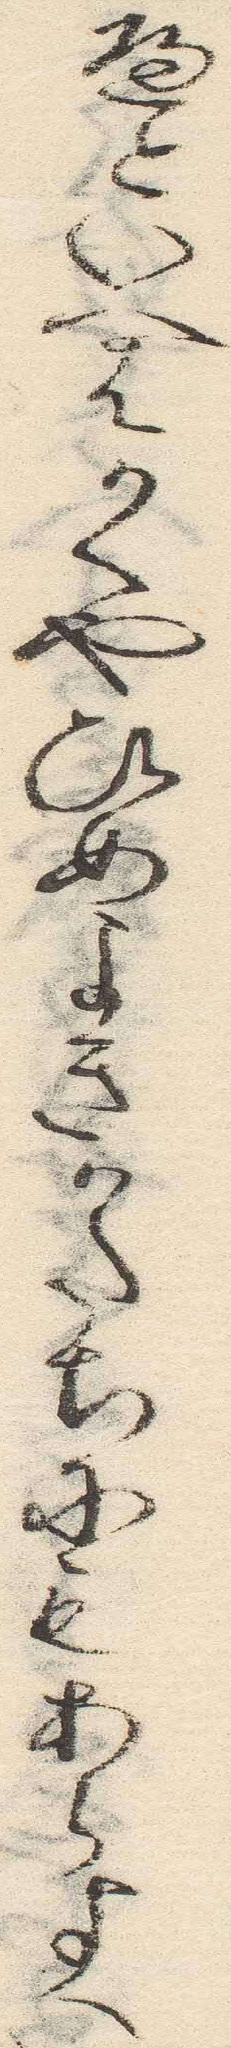へといへはかくやひめよきかたちにもあらすい
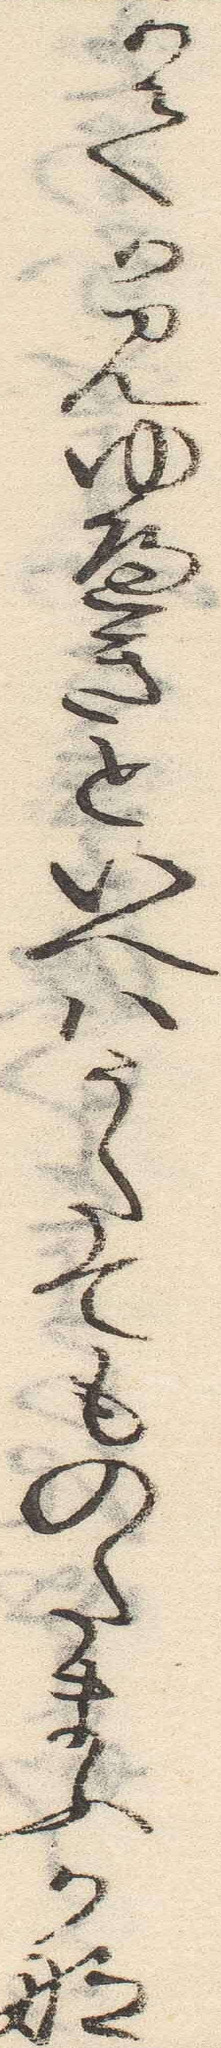かてか見ゆへきといへはうたてものたまふかな
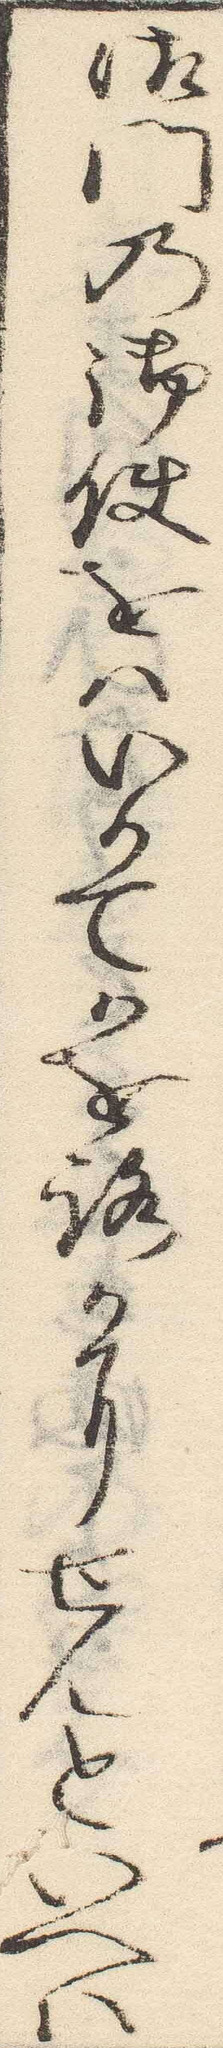御門の御使をはいかてかをろかにせんといへは
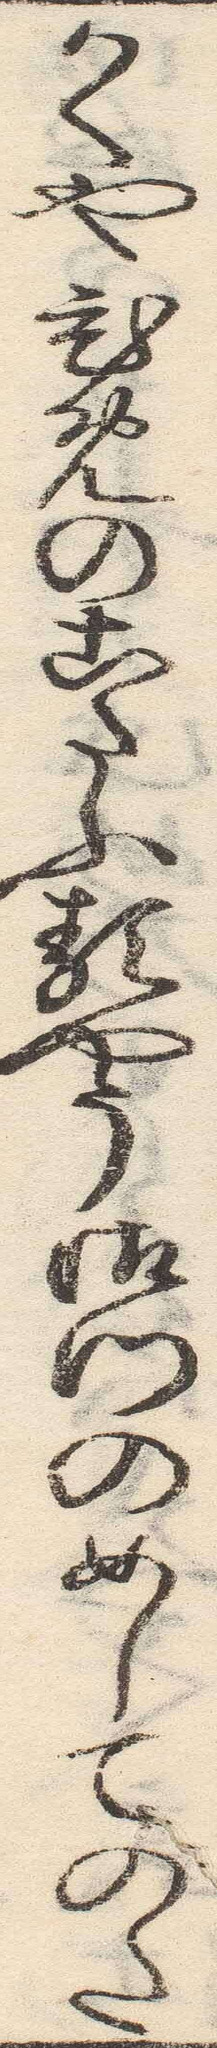かくやひめのこたふるやう御門のめしてのた
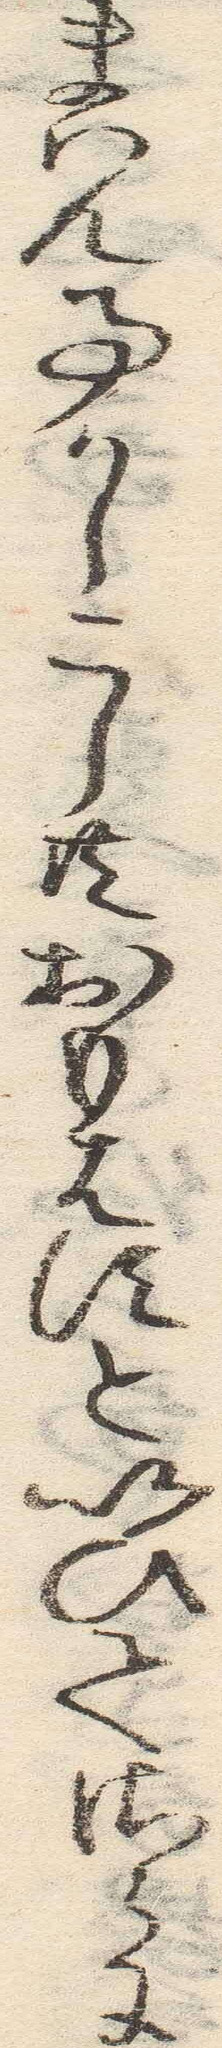まはん事かしこし共おもはすといひてさらに
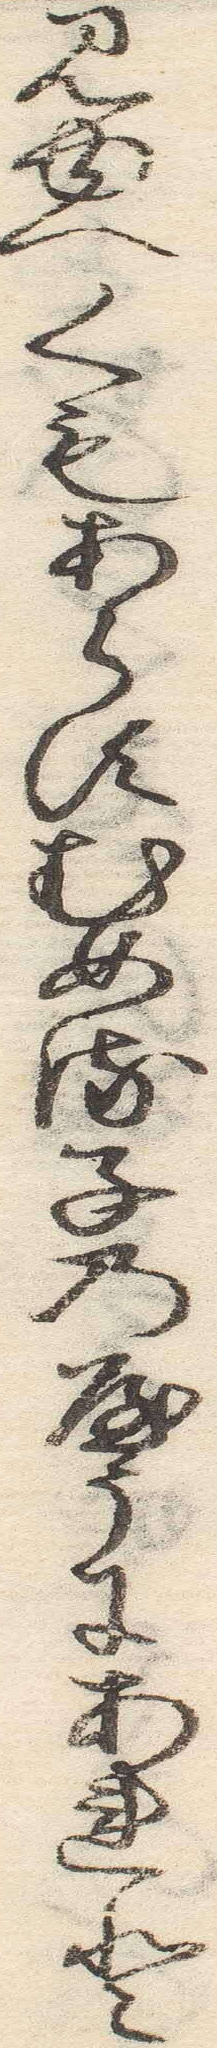見ゆへくもあらすむめる子のやうにあれと
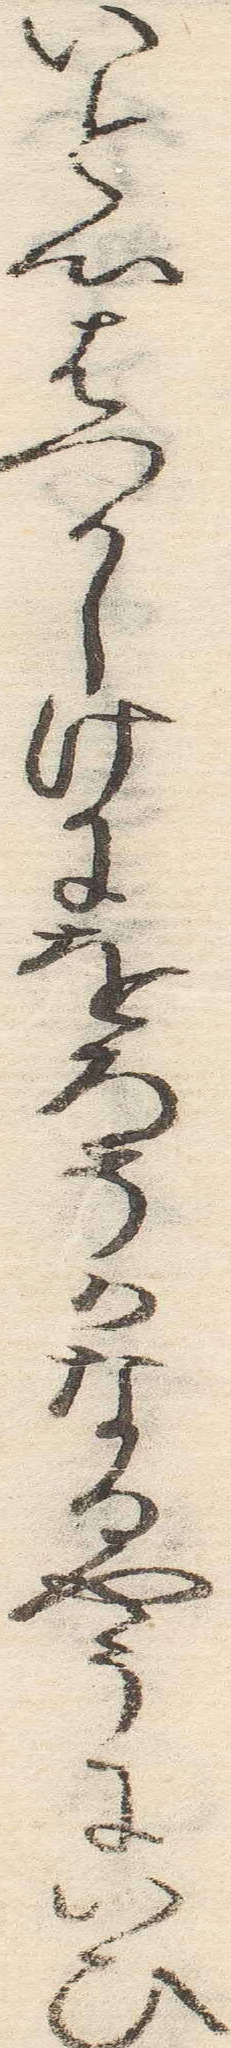いと心はつかしけにをろそかなるやうにいひ
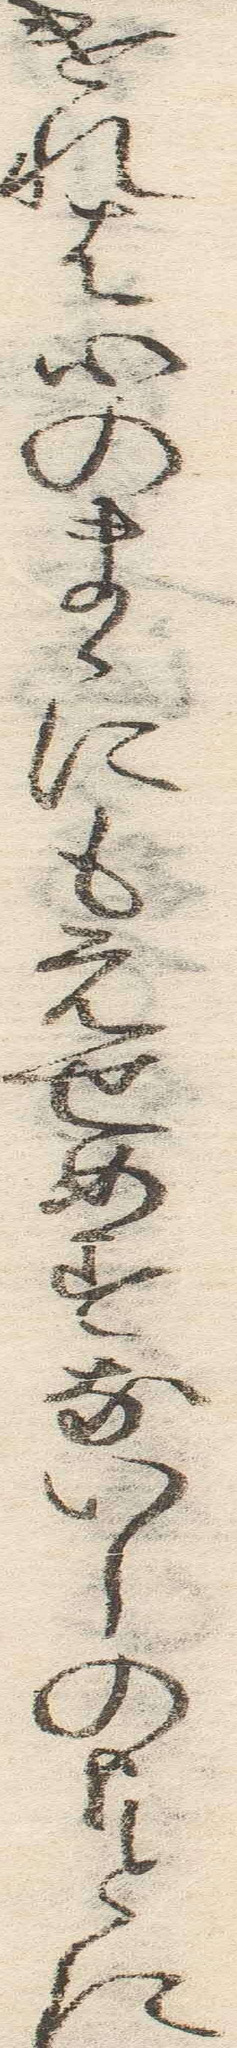けれは心のまゝにもえせめすないしのもとに
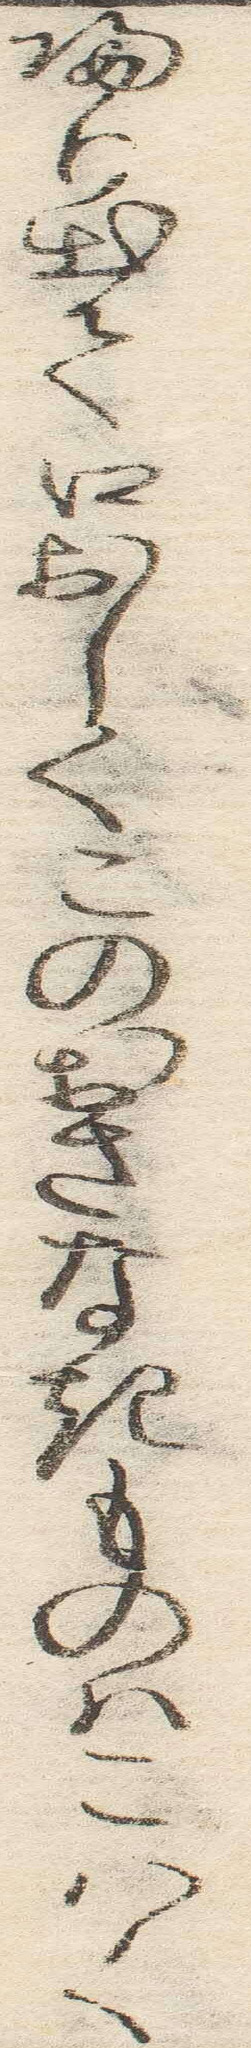帰り出て口おしくこのおさなきものはこはく
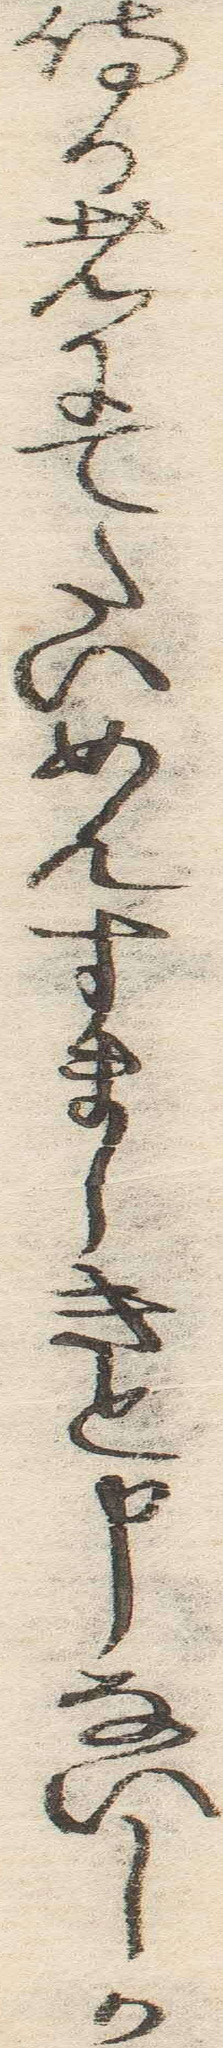侍る者にてたいめんすましきと申ないしか
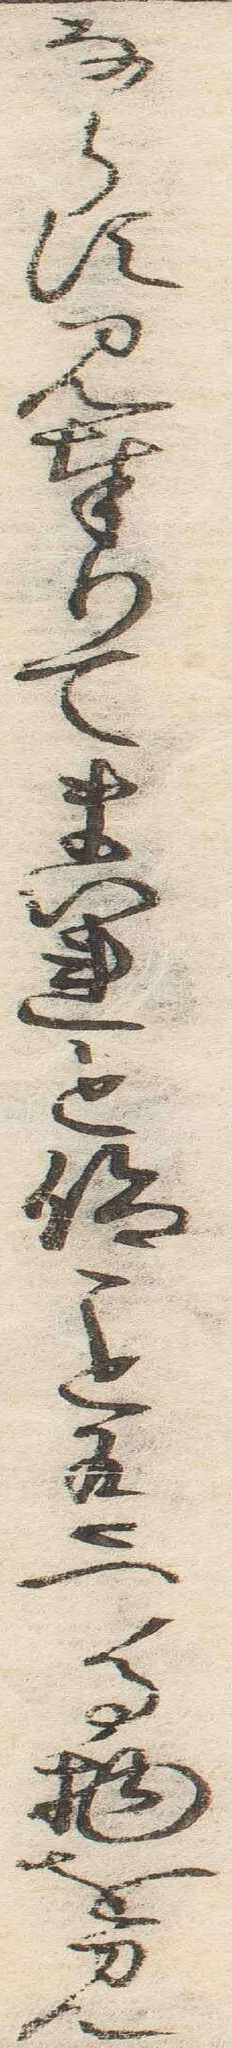ならす見奉りてまいれと仰こと有つる物を見
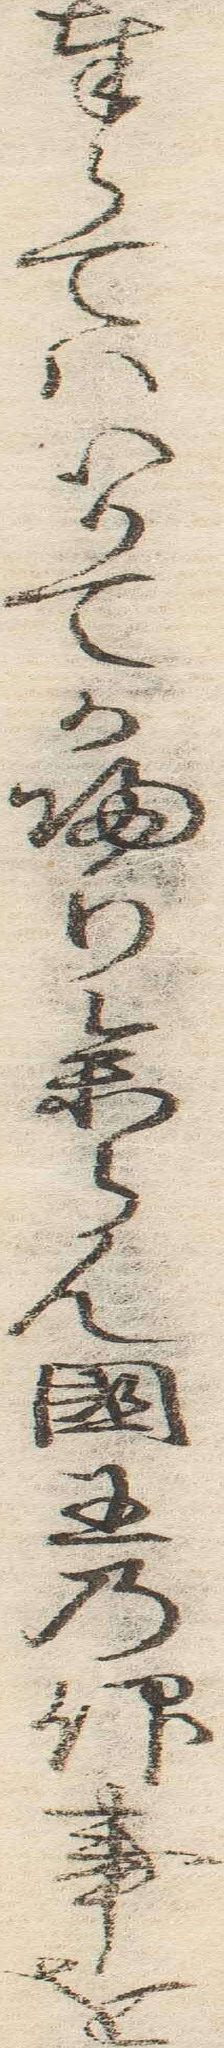奉らてはいかてか帰り参らん国王の仰事を
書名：竹取物語
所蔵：東京学芸大学附属図書館 国文学研究資料館
